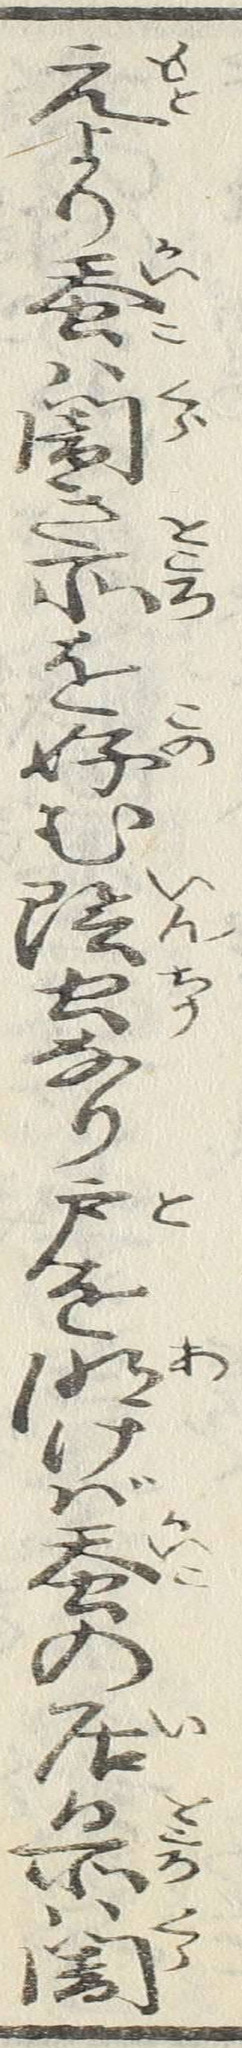元より蚕は闇き所を好む陰虫なり戸を明けば蚕の居る所は闇
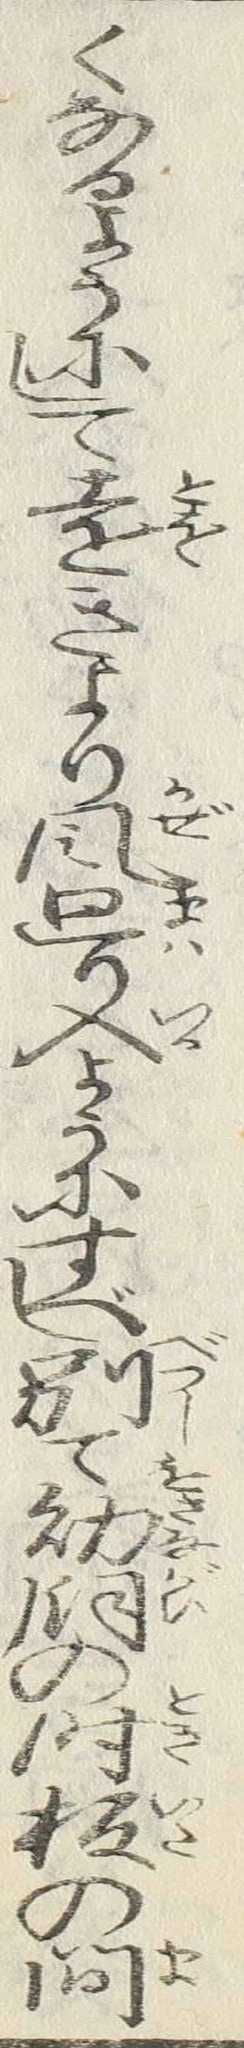くなるようにして遠きより風廻り入ようにすべし別て幼飼の時板の間
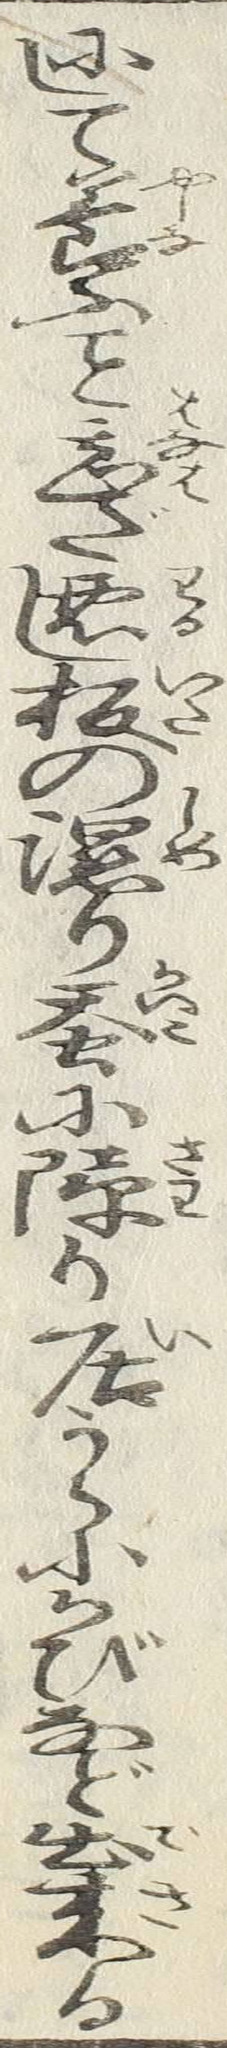にして養ふこと甚だ悪し板の湿り蚕に障り居うらにかびなど出来る
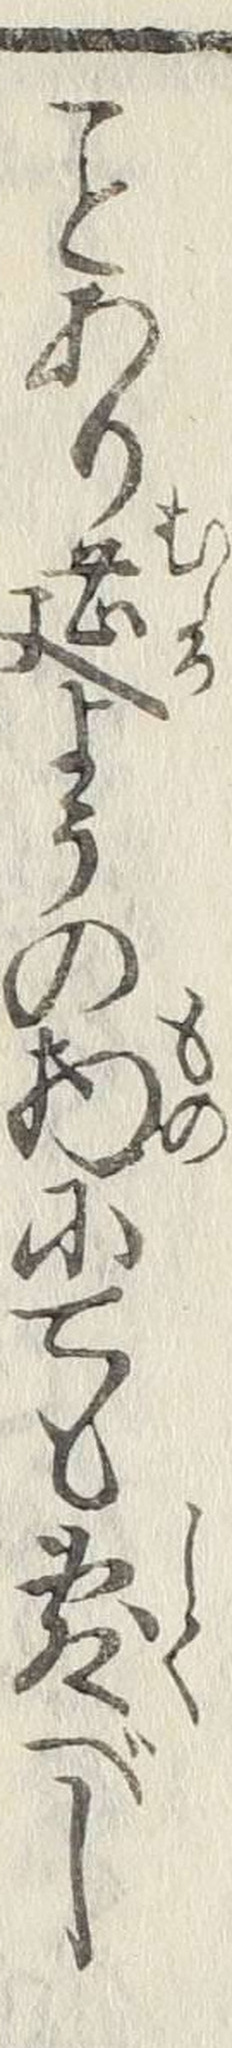ことあり筵ようの物にても敷べし
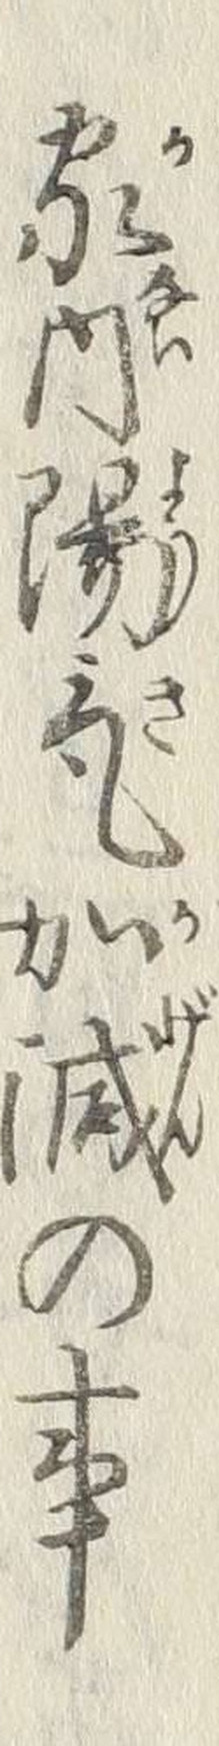家内陽気加減の事
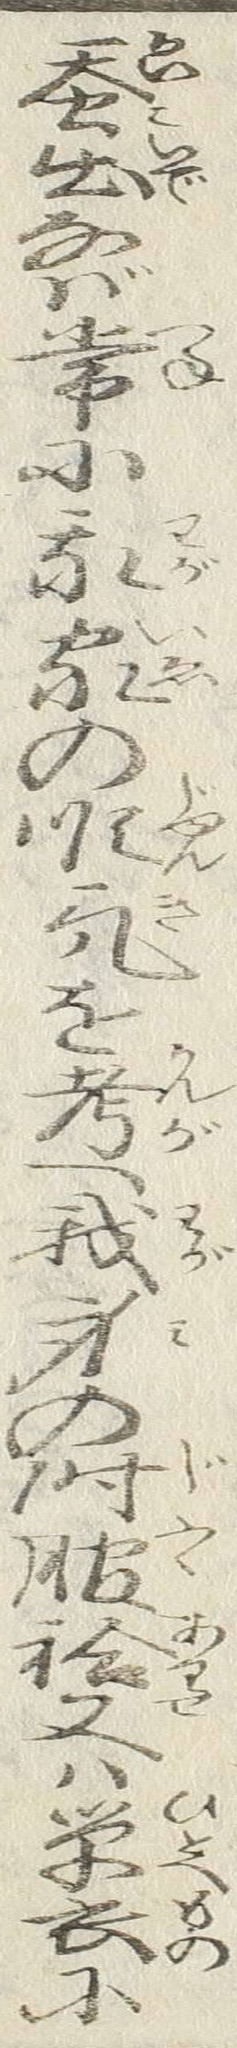蚕出なば常に我家の順気を考へ我身の時服袷又は単衣に
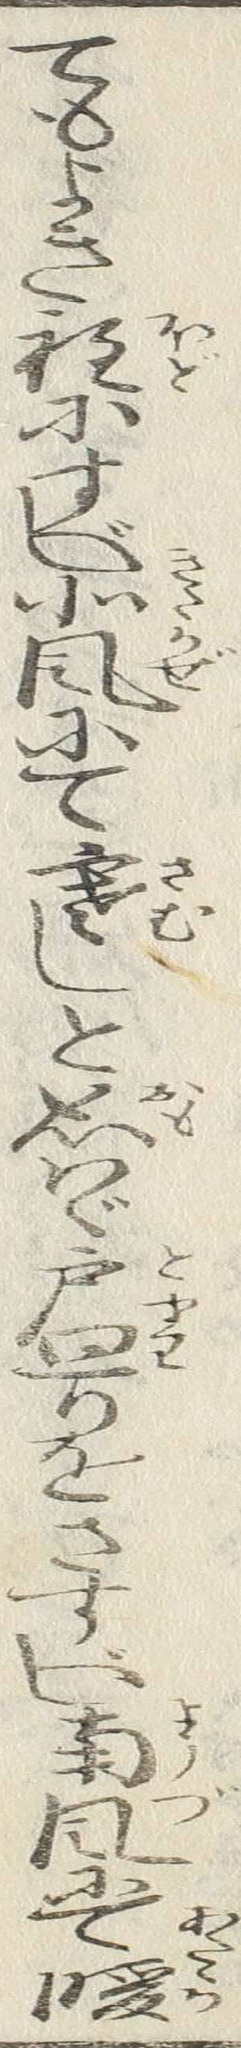てもよき程にすべし北風にて寒しと思はゞ戸廻りをさすべし南風にて暖
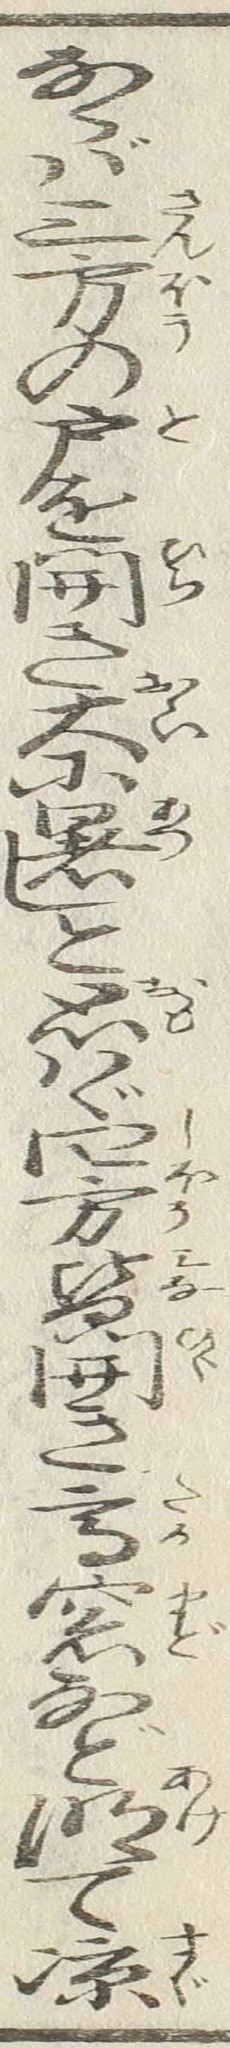ならば三方の戸を開き大に暑しと思はゞ四方皆開き高窓など明て涼
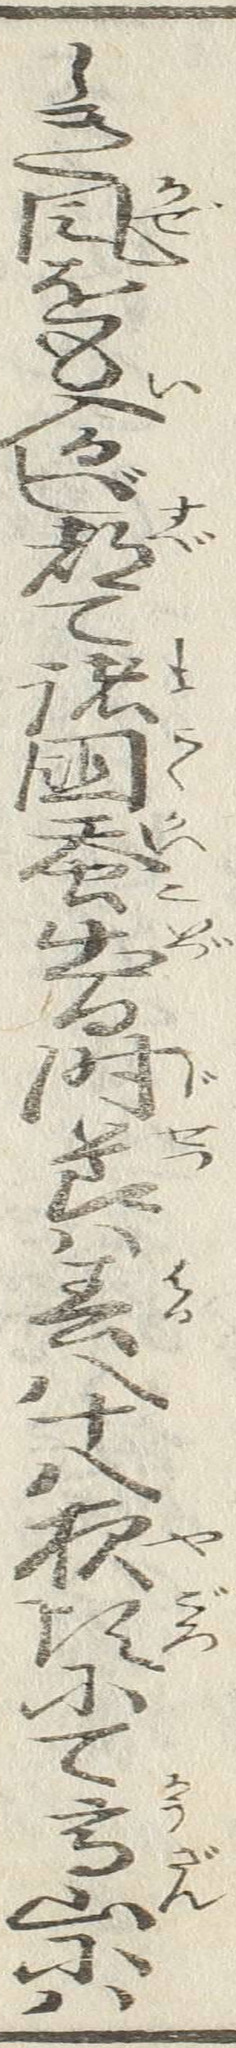しき風をも入るべし都て諸国蚕出る時節は春八十八夜頃にて高山には
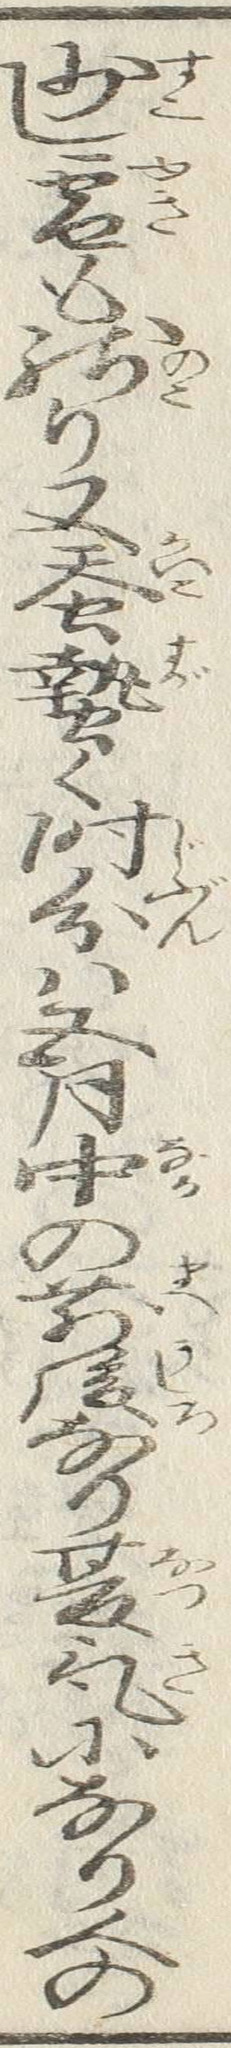少し雪も残り又蚕蟄く時分は五月中の前後なり夏気になり人の
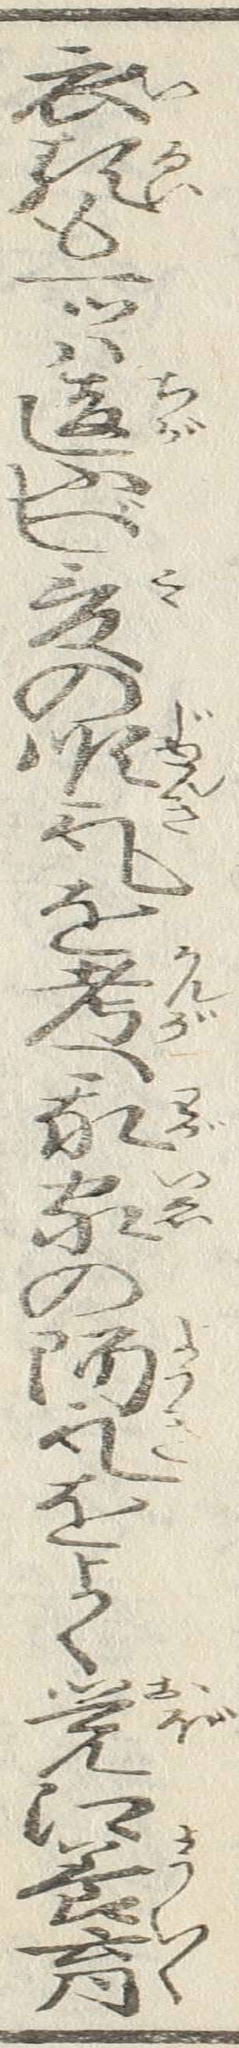衣類も一ッは違ふべし爰の順気を考へ我家の陽気をよく覚え養育
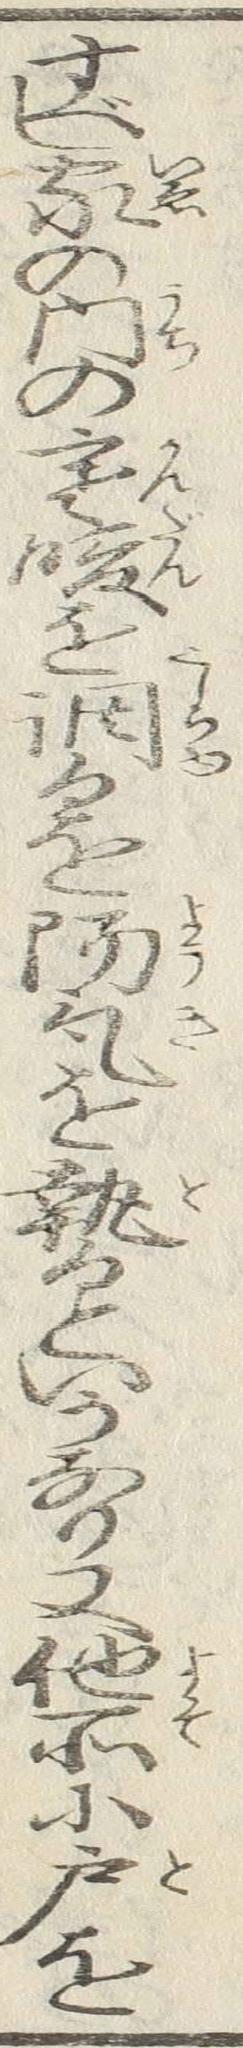すべし家の内の寒暖を調るを陽気を執るというなり又他所に戸を
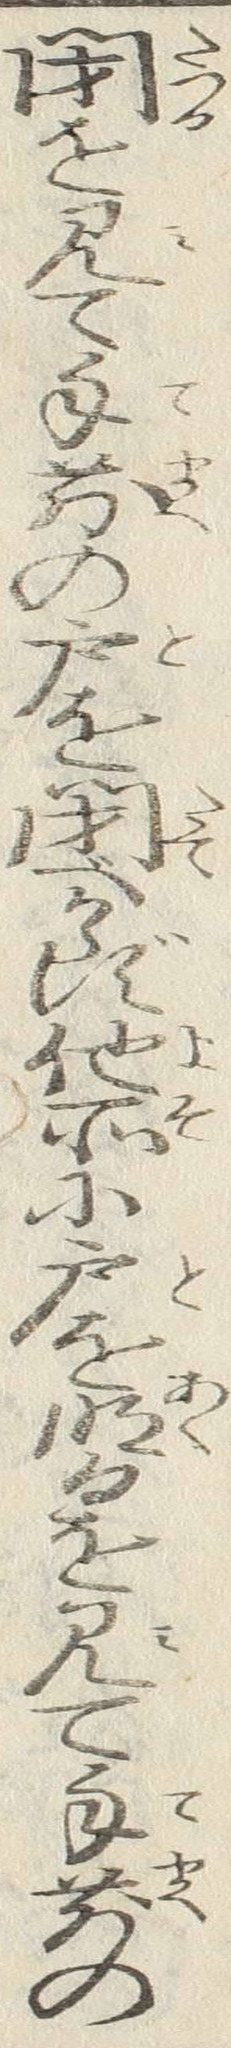閉を見て手前の戸を閉べからず他所に戸を明るを見て手前の
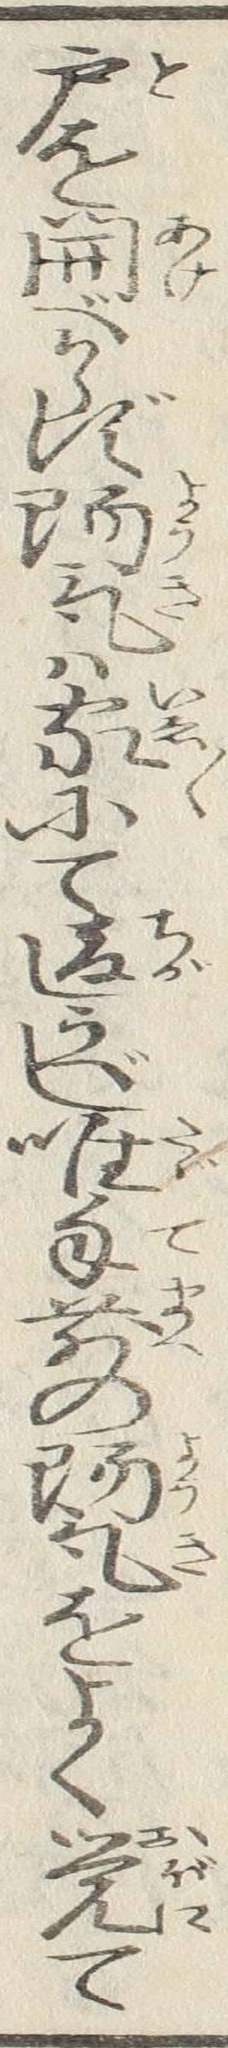戸を開べからず陽気は家にて違うべし唯手前の陽気をよく覚て

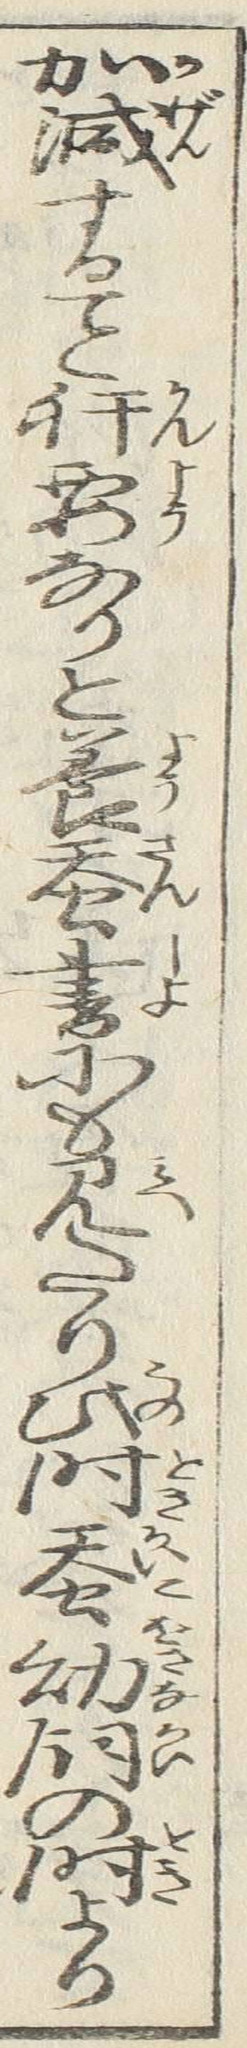加減すること肝要なりと養蚕書にも見たり此時蚕幼飼の時より
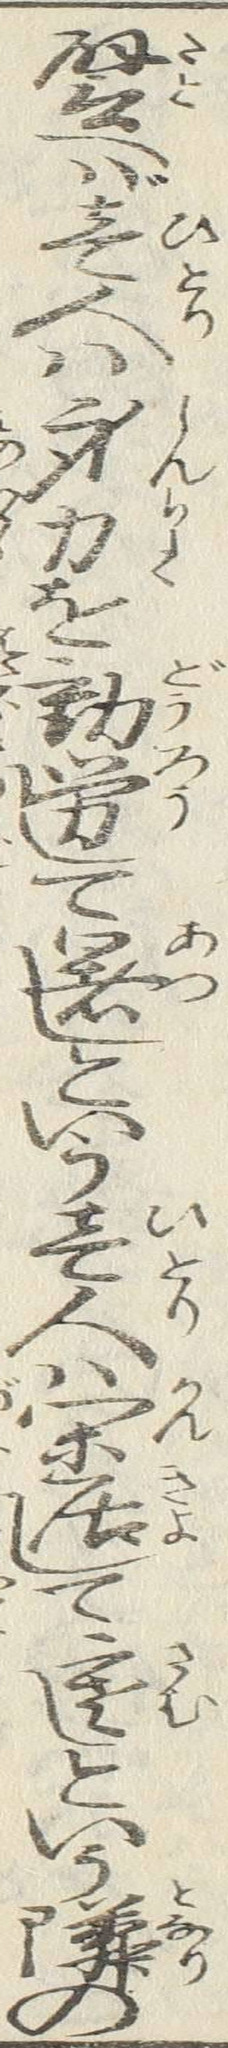譬へば壱人は身力を動労して暑しという壱人は閑居して寒しという隣の
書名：養蠶實驗録
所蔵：東京大学農学生命科学図書館 国文学研究資料館
